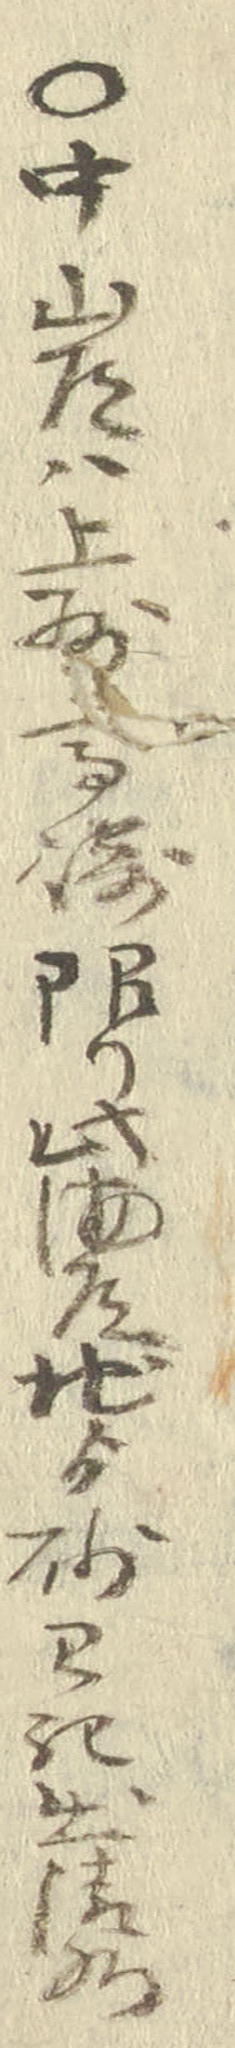◯中山道ハ上州高崎限り此海道地ゟ砂わき出清水
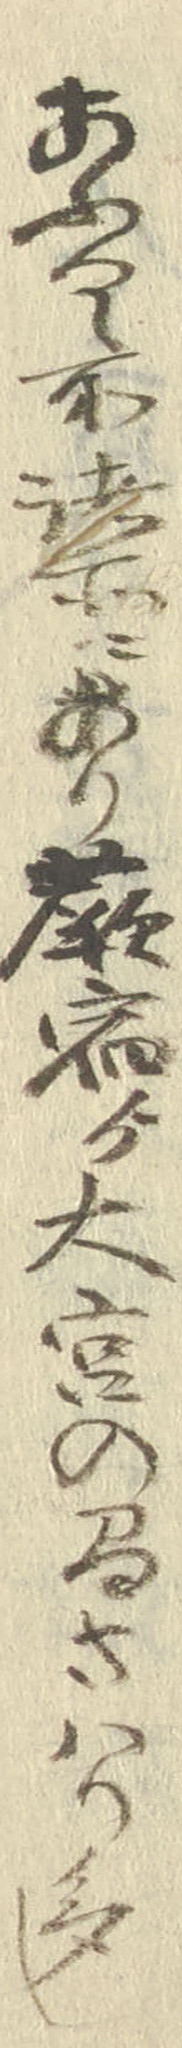あふるゝ所諸所ニあり蕨宿ゟ大宮の間さハり多し
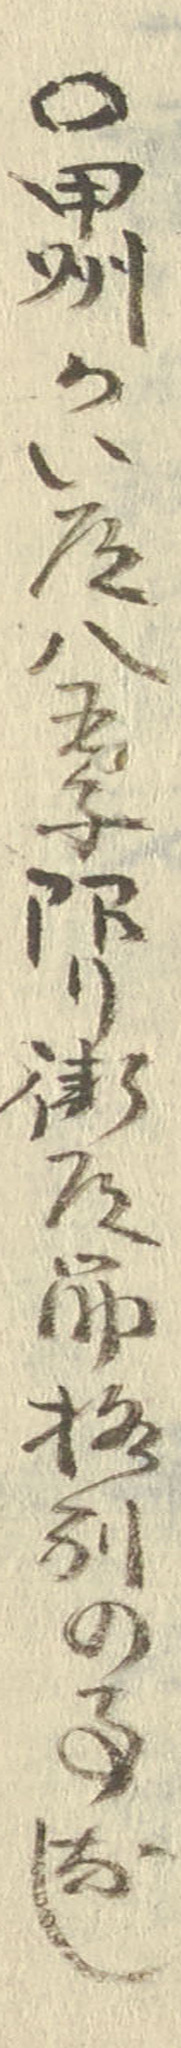◯甲州かい道八王子限り街道筋格別の事なし
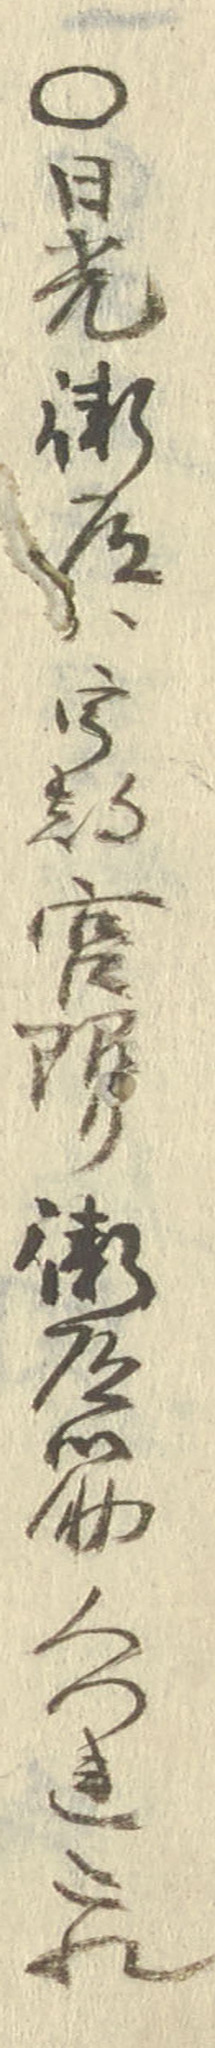◯日光街道ハ宇都宮限り街道筋くつれこれ
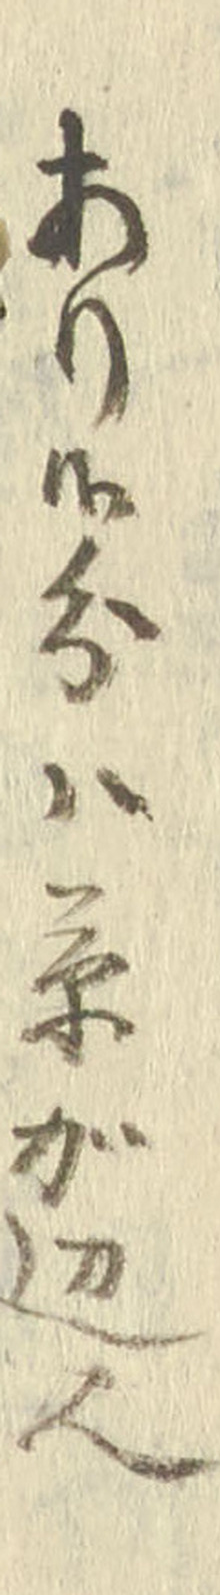あり候分ハ草加辺也
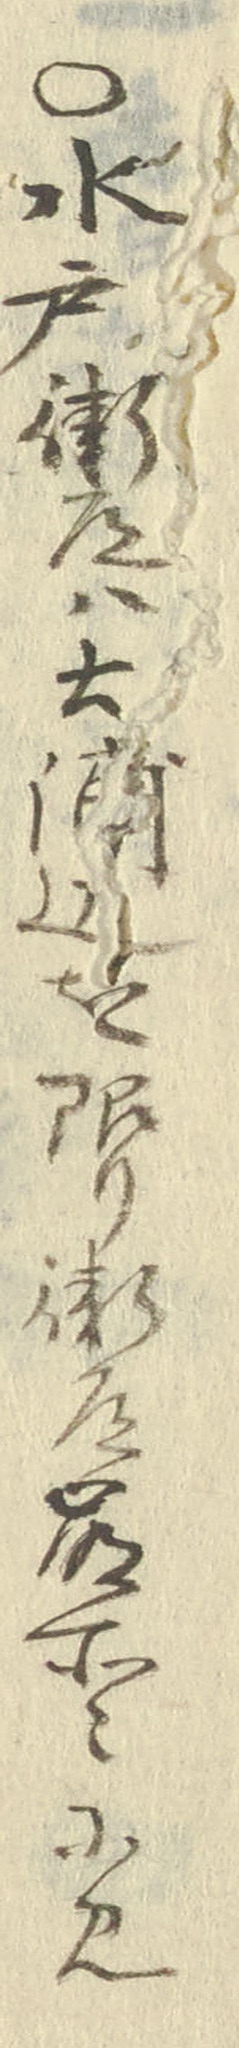◯水戸街道ハ土浦を限り街道筋所〻に見
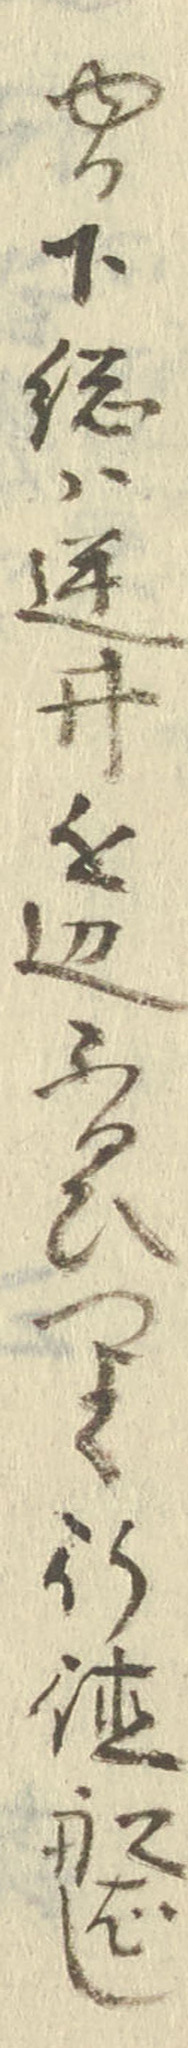ゆる下総ハ逆井近辺ふるひつよく行徳船ばし
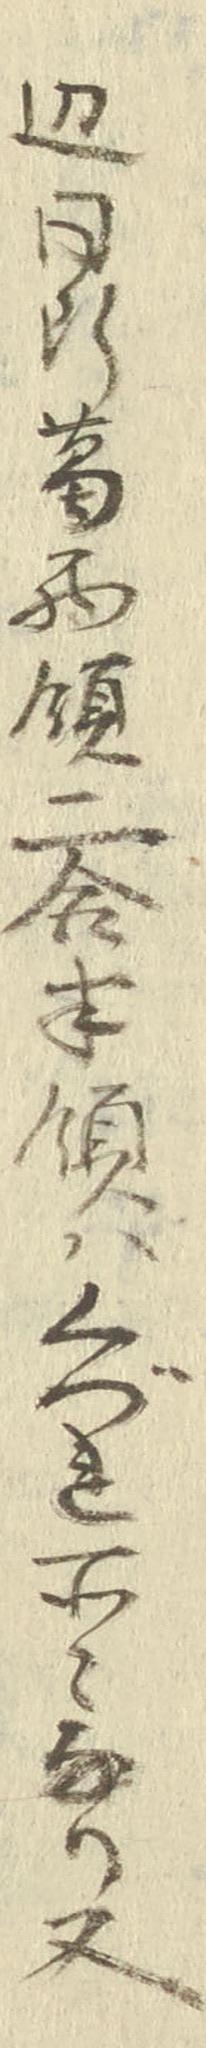辺同断葛西領二合半領ハくずれ所〻なり又
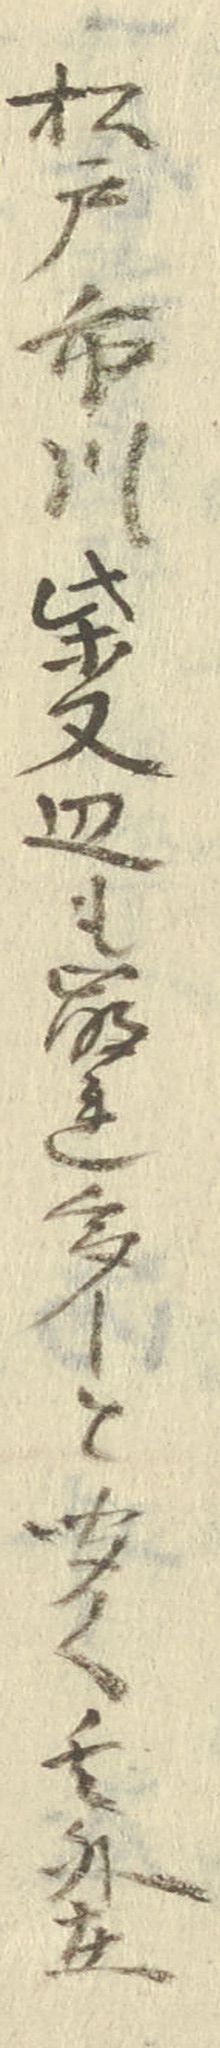松戸市川柴又辺も崩れ多しと聞く其外在
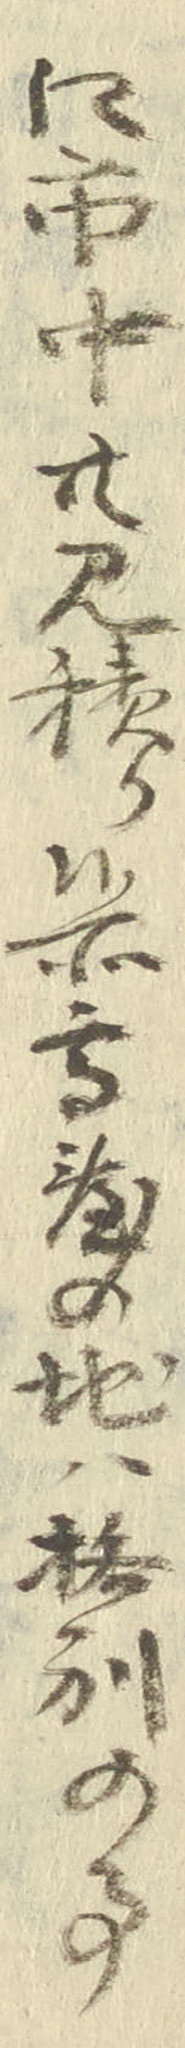郷市中共見積り候所高臺の地ハ格別の事
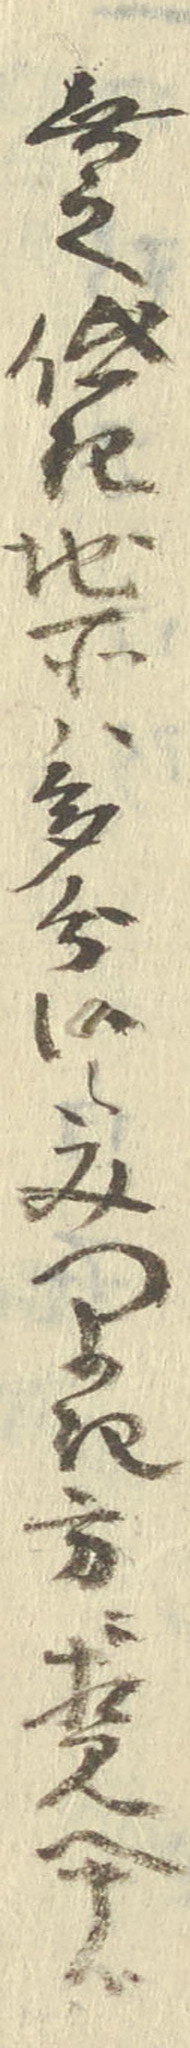無之低き地所ハ多分いたみつよき方ニ相見へ申候
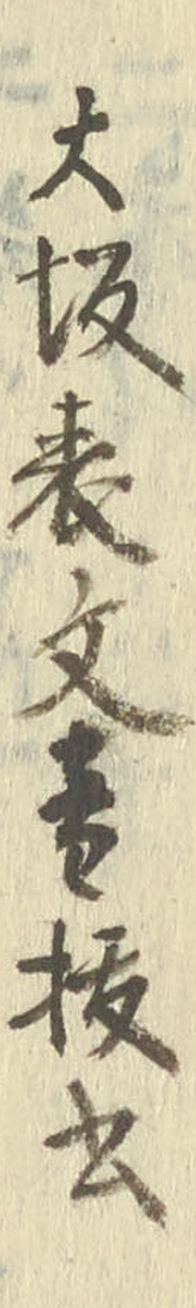大坂表文言抜書
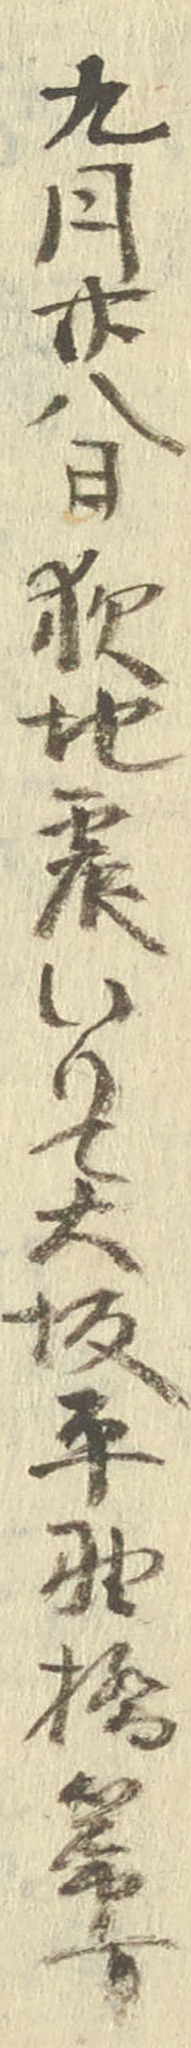九月廿八日夜地震いりて大坂平野橋箒丁
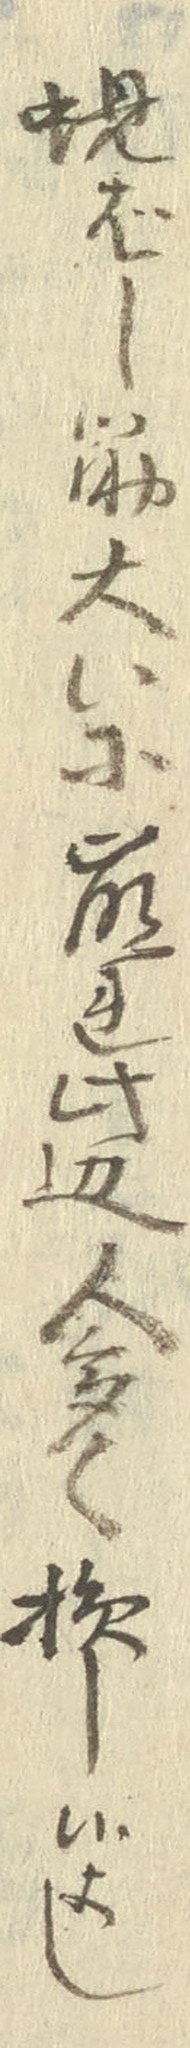蜆ばし筋大いに崩れ此辺人多く損し候よし
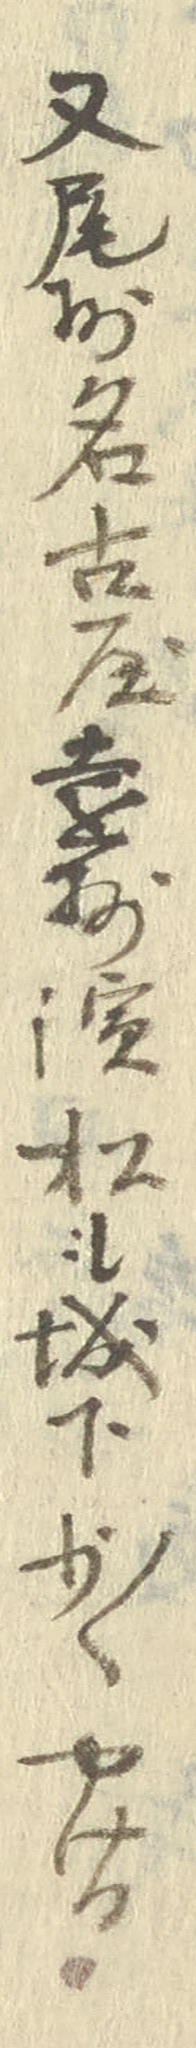又尾州名古屋遠州濱松も城下少〳〵やける
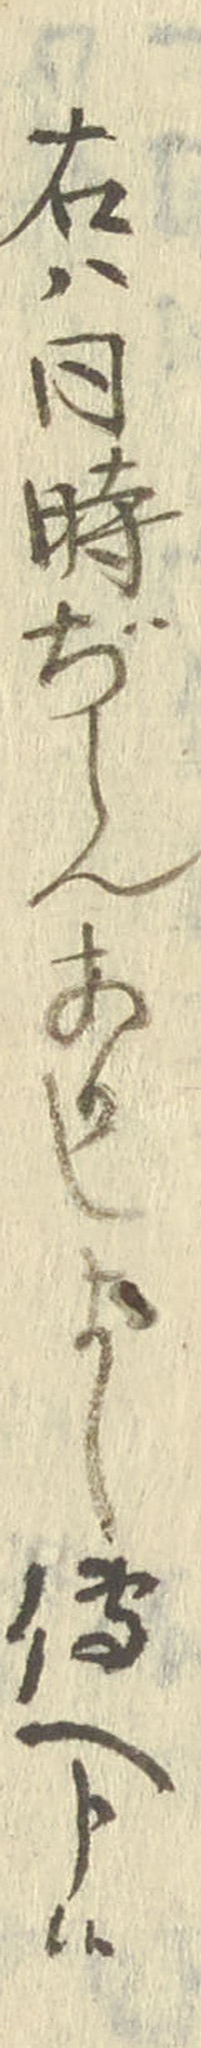右は同時ぢしんありしよし傳へ申候
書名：御府内御屋敷方市中共地震類焼場所明細書之冩兼街道筋近郷聞書
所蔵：東京大学総合図書館 General Library in the University of Tokyo, JAPAN
